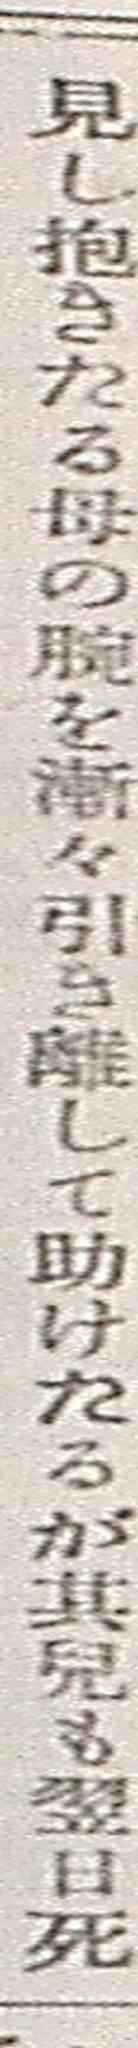見し抱きたる母の腕を漸々引き離して助けたるが其兒も翌日死
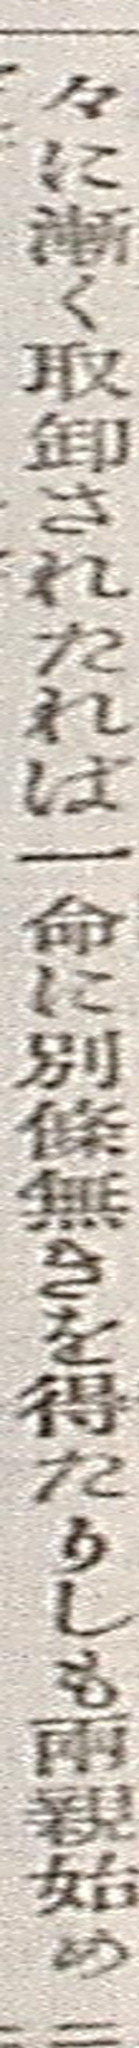々に漸く取卸されたれば一命に別条無きを得たりしも両親始め
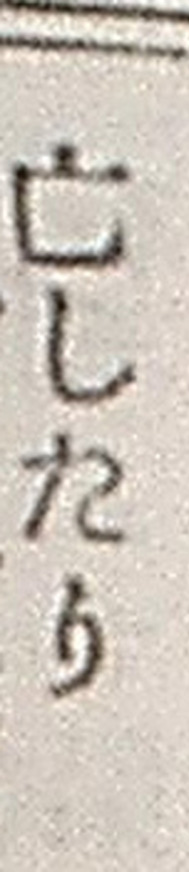亡したり
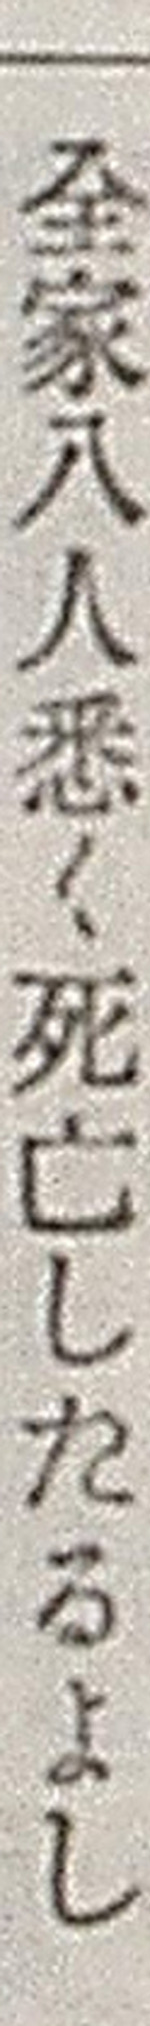全家八人悉く死亡したるよし
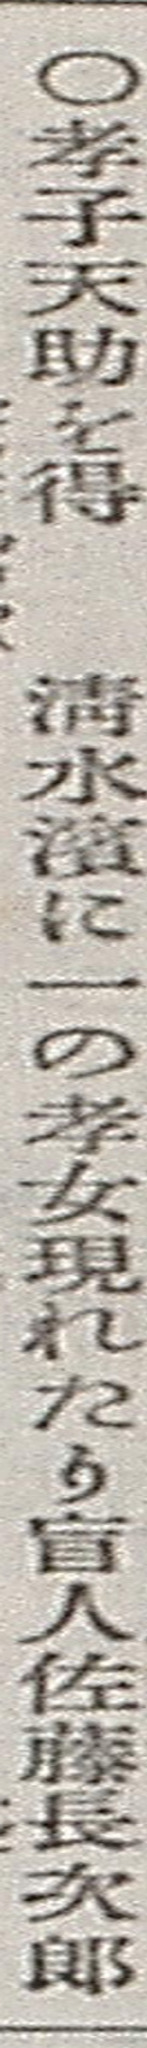○孝子天助を得清水浜に一の孝女現れたり盲人佐藤長次郎
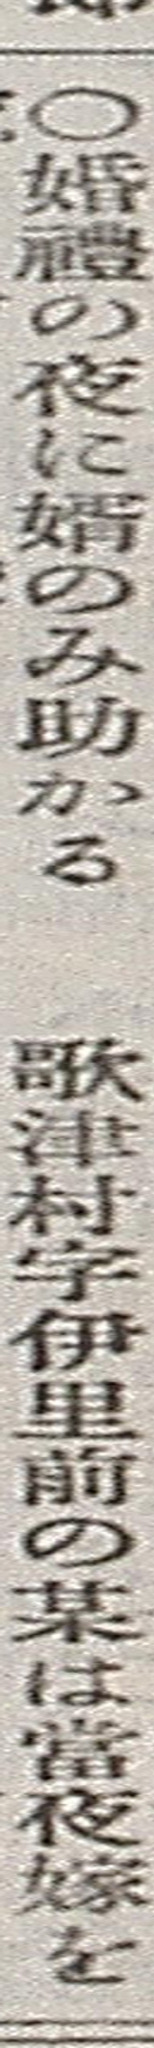○婚礼の夜に婿のみ助かる歌津村字伊里前の某は当夜嫁を
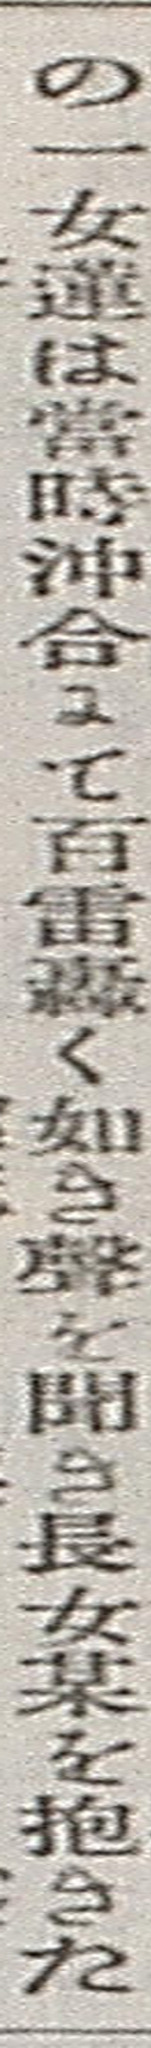の一女蓮は当時沖合にて百雷轟く如き声を聞き長女某を抱きた
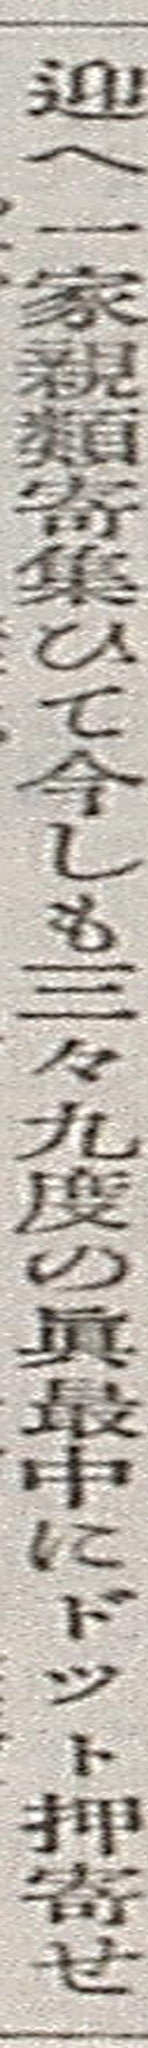迎へ一家親類寄集ひて今しも三々九度の真最中にドツト押寄せ
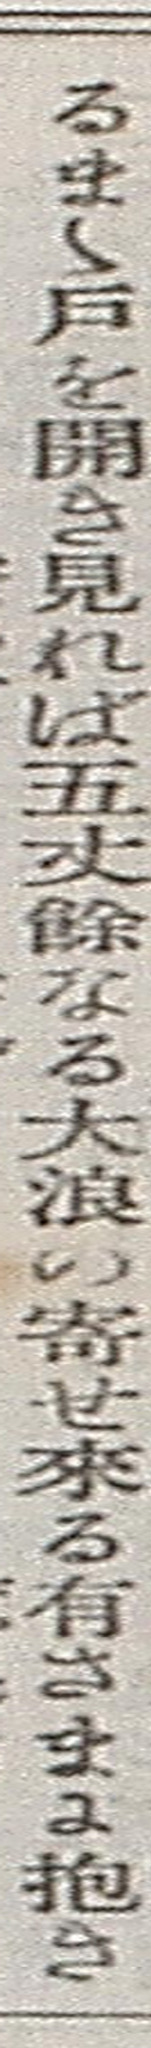るまゝ戸を開き見れば五丈余なる大浪の寄せ来る有さまに抱き
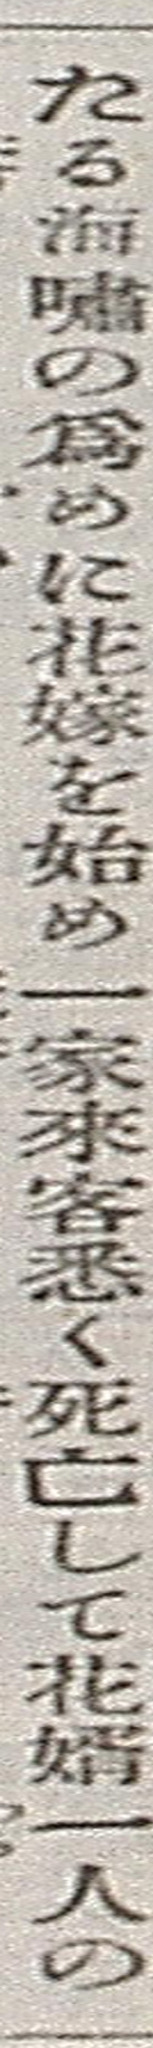たる海嘯の為めに花嫁を始め一家来客悉く死亡して花婿一人の
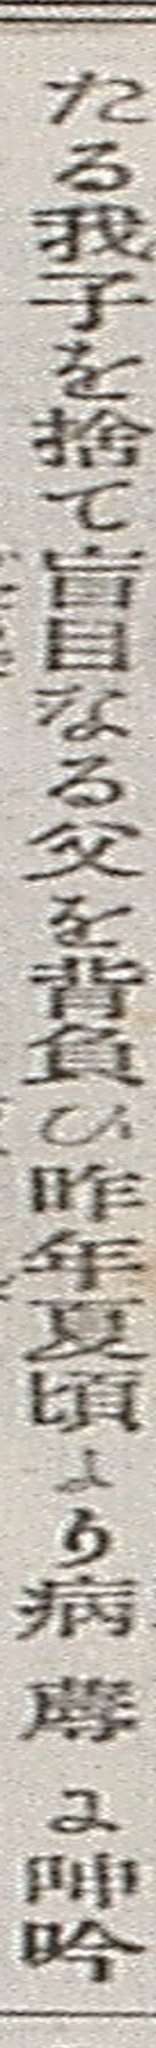たる我子を捨て盲目なる父を背負ひ昨年夏頃より病蓐に呻吟
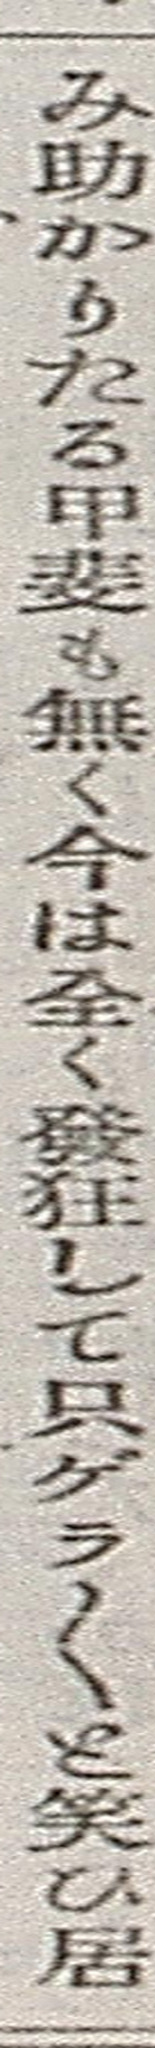み助かりたる甲斐も無く今は全く発狂して只ゲラ〳〵と笑ひ居
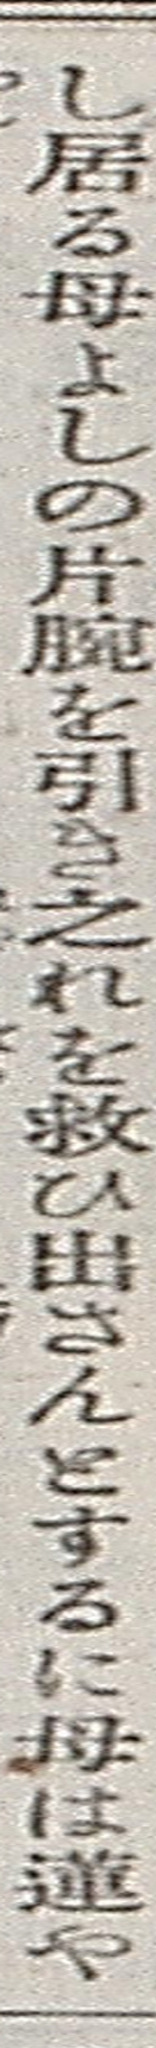し居る母よしの片腕を引き之れを救ひ出さんとするに母は蓮や
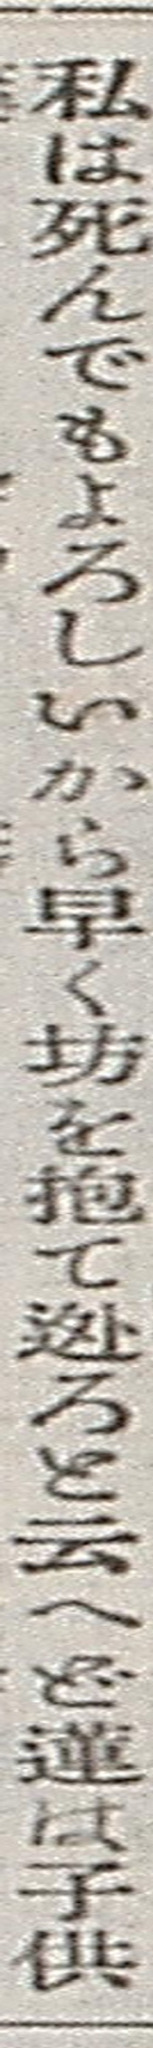私は死んでもよろしいから早く坊を抱て迯ろと云へど蓮は子供
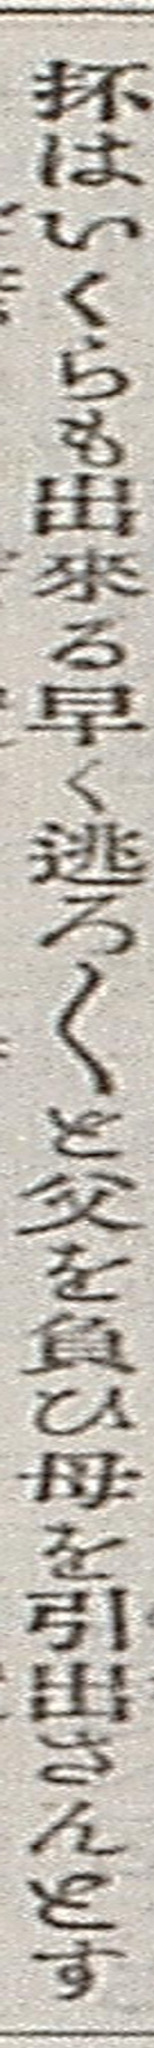抔はいくらでも出来る早く逃ろ〳〵と父を負ひ母を引出さんとす
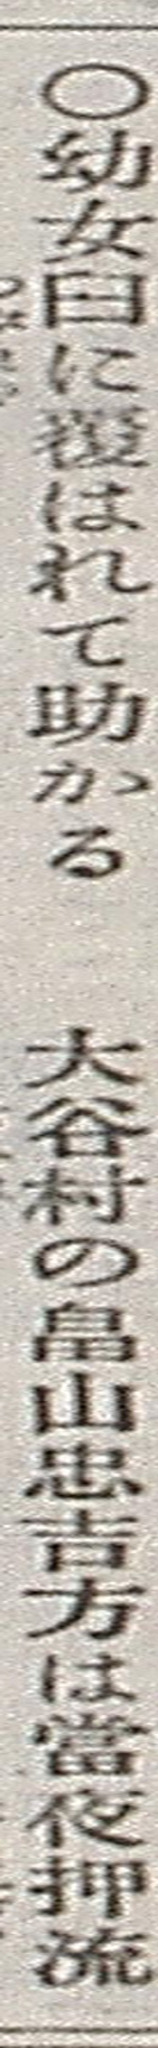○幼女臼に覆はれて助かる大谷村の畠山忠吉方は当夜押流
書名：風俗畫報臨時増刊第百二十號　大海嘯被害録（下）
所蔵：東京大学地震研究所図書室 Earthquake Research Institute Library, The University of Tokyo, JAPAN
